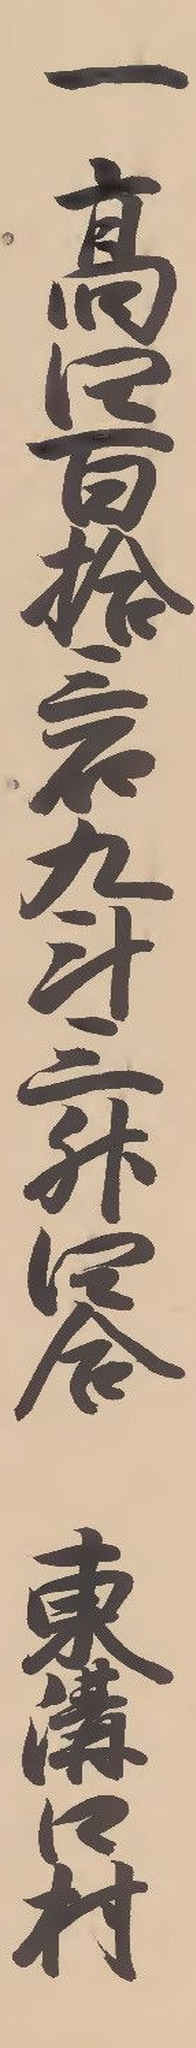一高四百拾三石九斗三升四合東溝口村
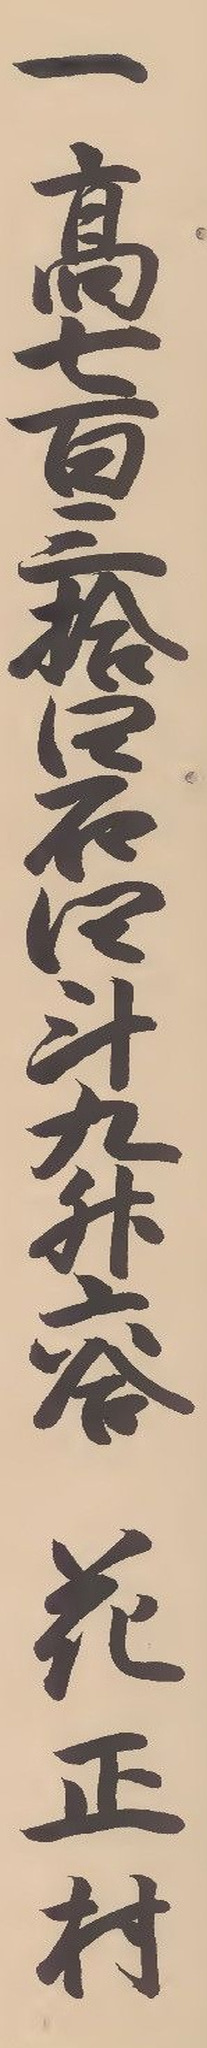一高七百三拾四石四斗九升六合花正村
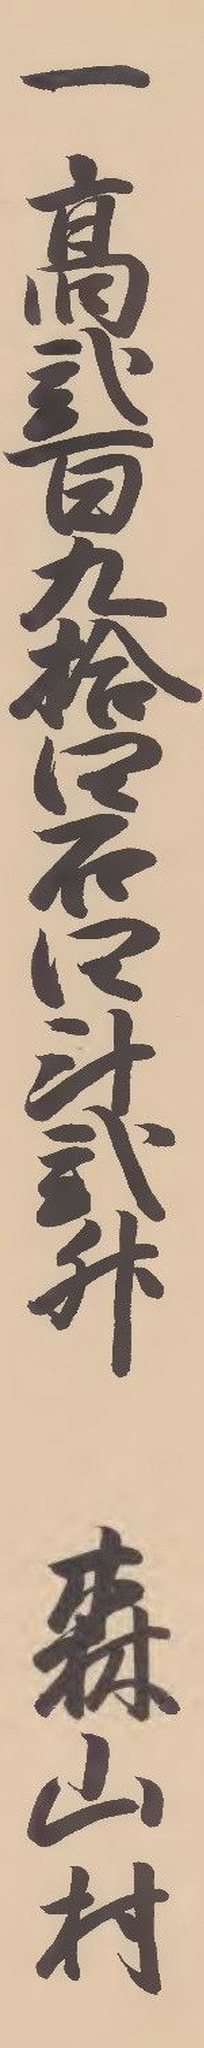一高弐百九拾四石四斗弐升森山村
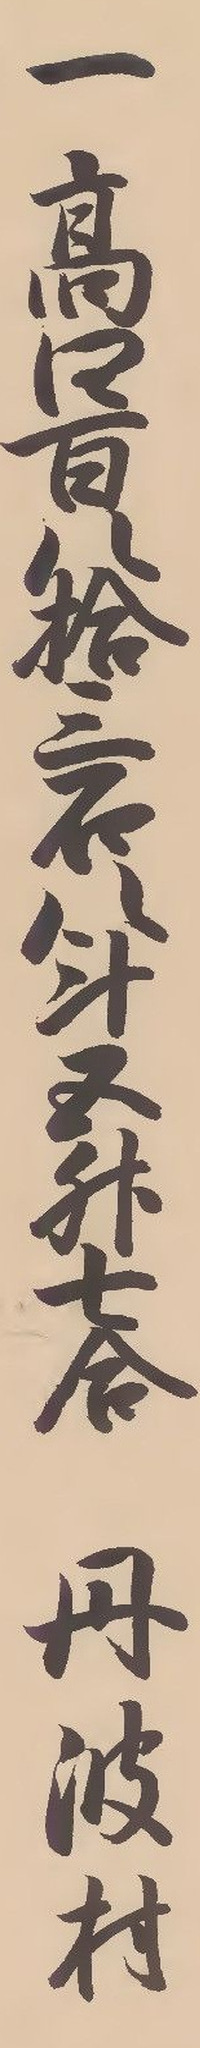一高四百八拾三石八斗五升七合丹波村

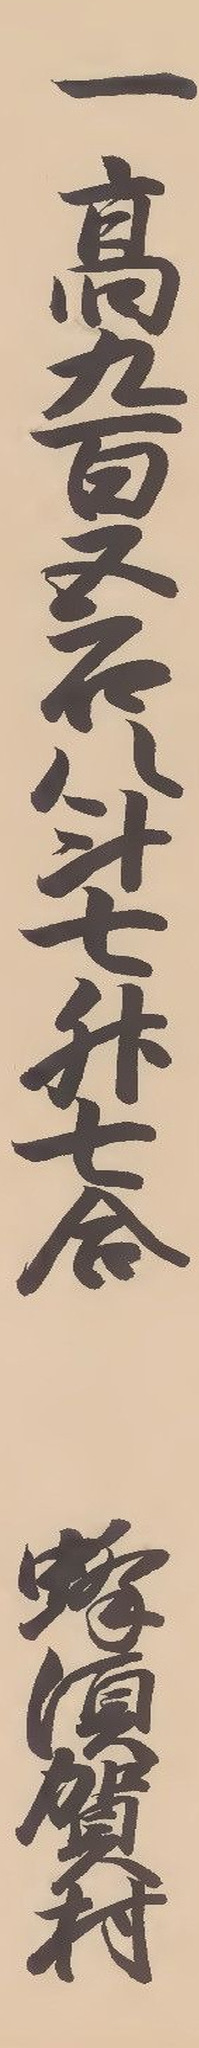一高九百五石八斗七升七合蜂須賀村
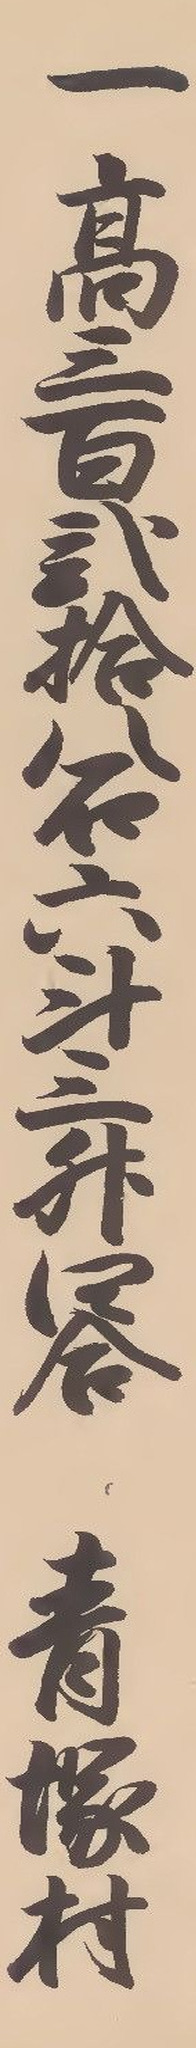一高三百弐拾八石六斗三升四合青塚村
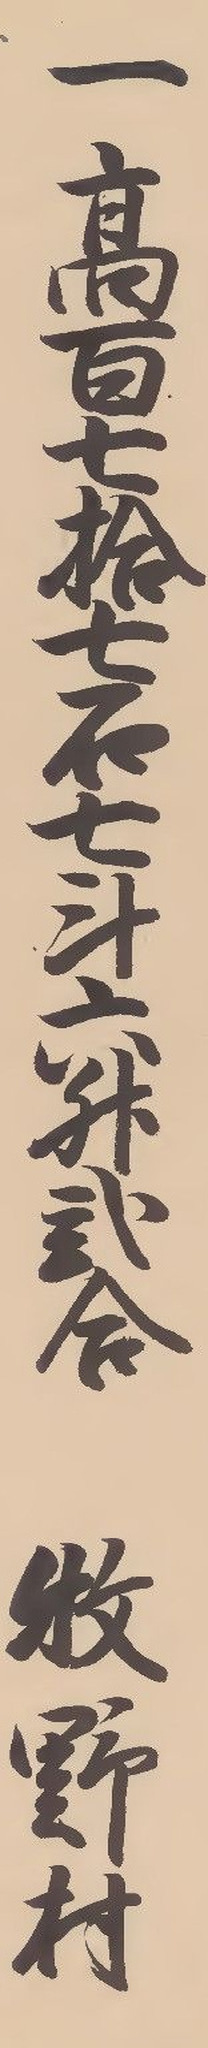一高百七拾七石七斗六升弐合牧野村
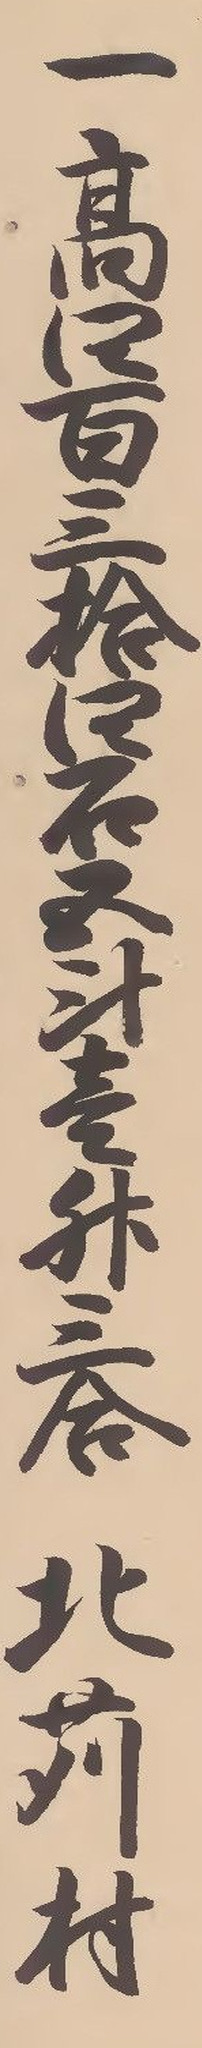一高四百三拾四石五斗壱升三合北苅村
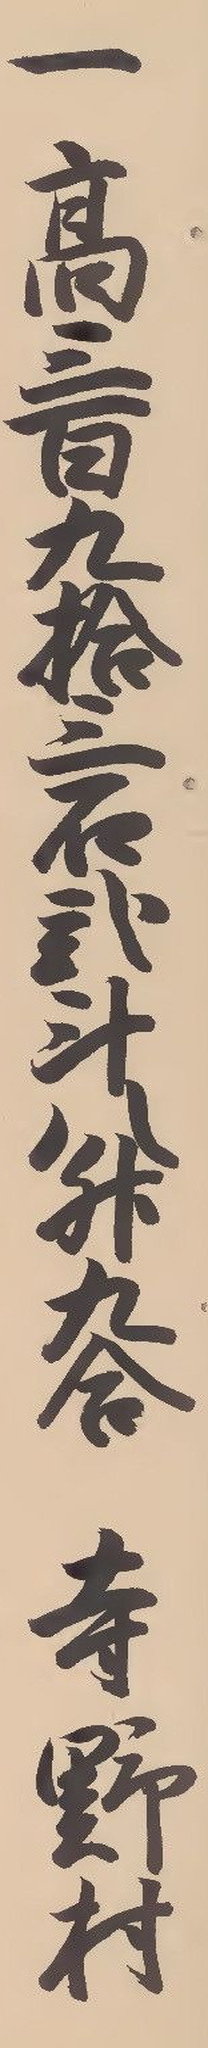一高三百九拾三石弐斗八升九合寺野村
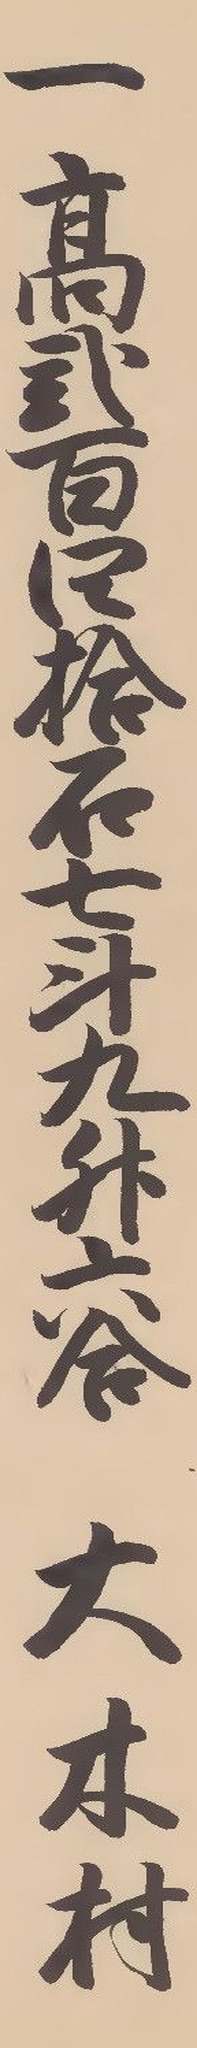一高弐百四拾石七斗九升六合大木村
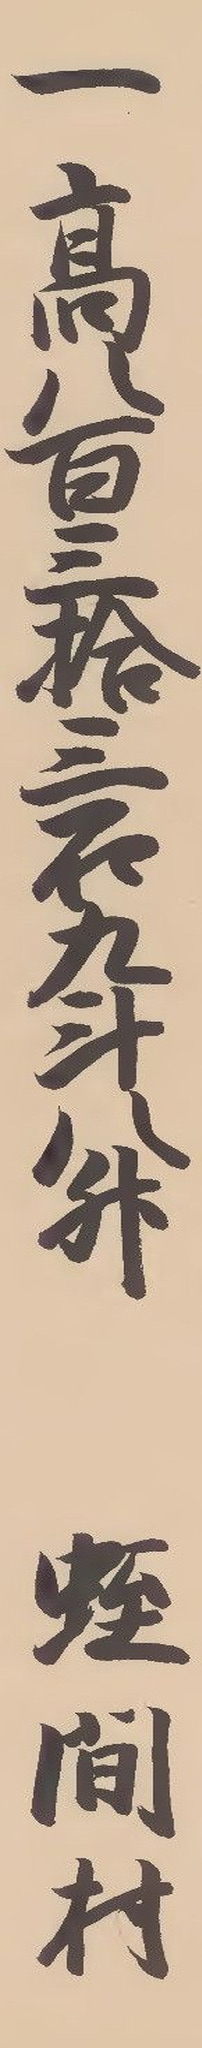一高八百三拾三石九斗八升蛭間村
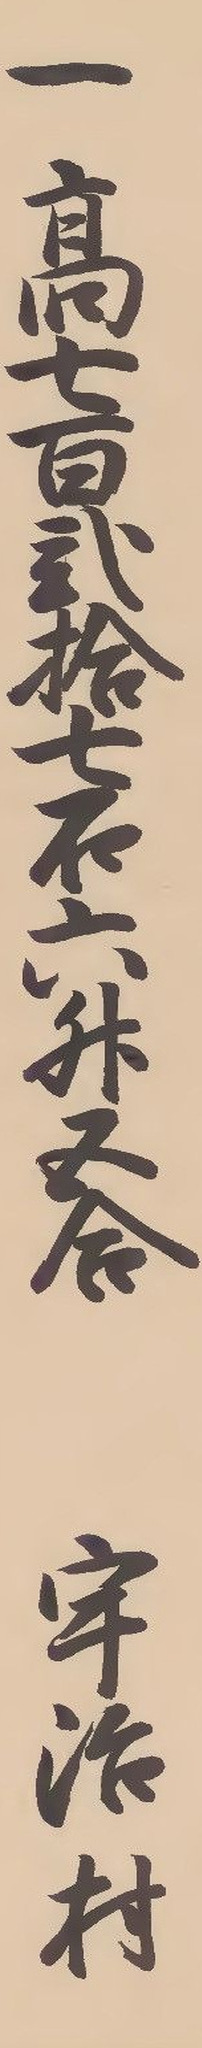一高七百弐拾七石六升五合宇治村

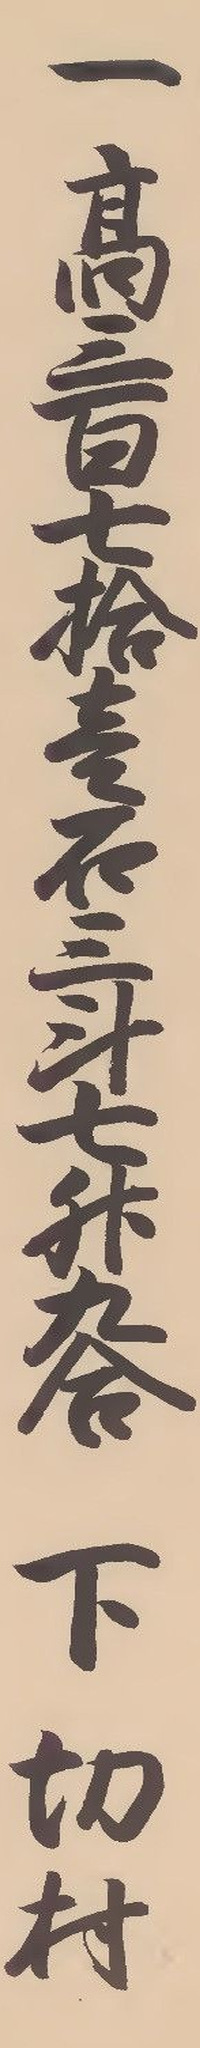一高三百七拾壱石三斗七升九合下切村
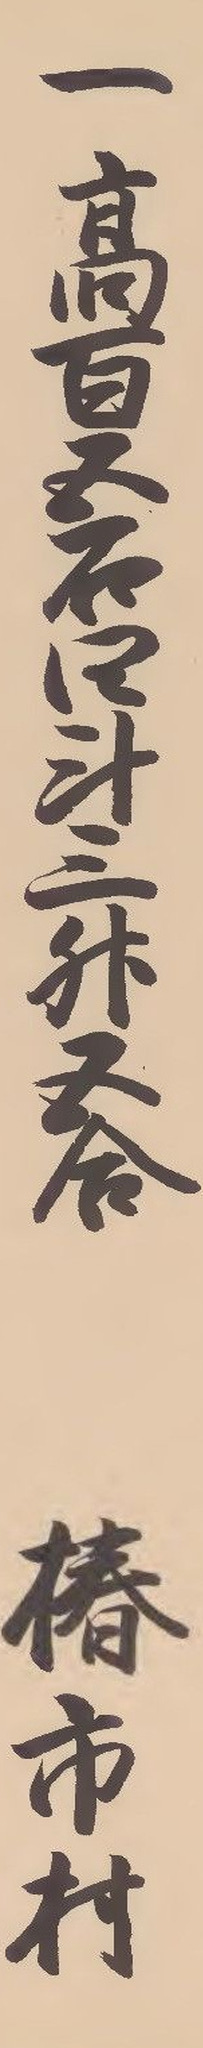一高百五石四斗三升五合椿市村
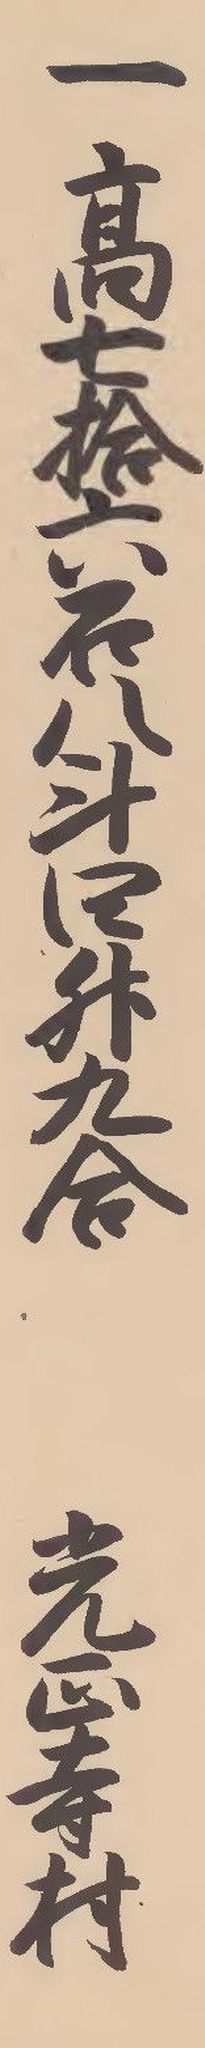一高七拾六石八斗四升九合光正寺村
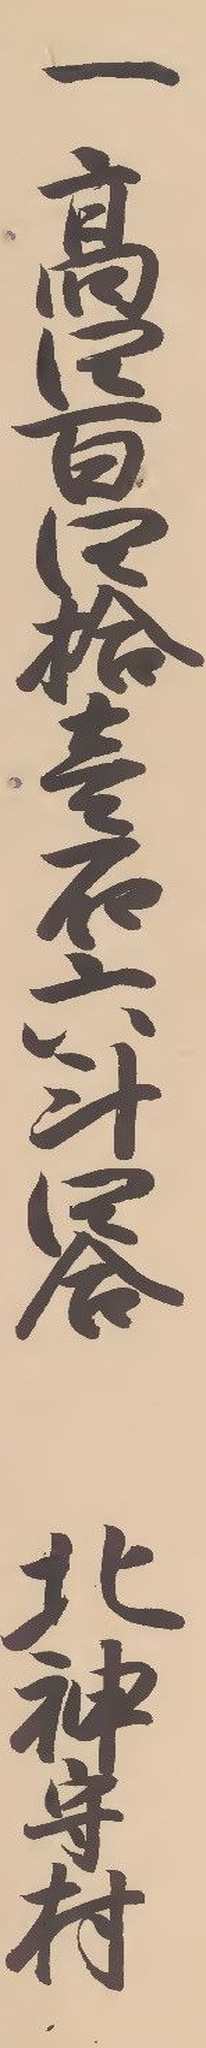一高四百四拾壱石六斗四合北神守村
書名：尾張国郷帳
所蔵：国立公文書館 National Archives of Japan
